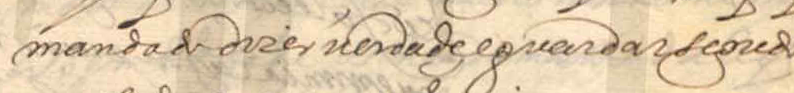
mandado dizer uerdade, e guardar segredo
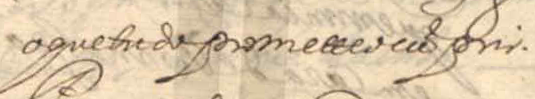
o que tudo prometteo cūprir.
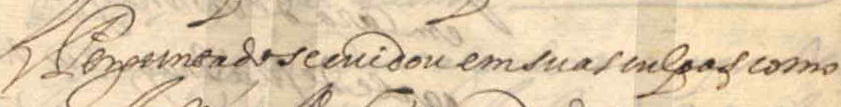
Perguntado se cuidou em suas culpas como
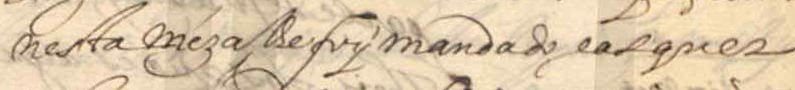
nesta mesa lhe foy mandado e as quer
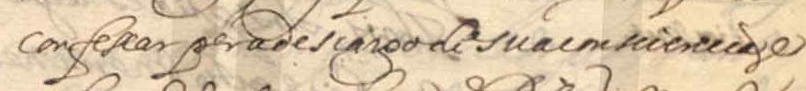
confessar pera descargo de sua consciencia, e
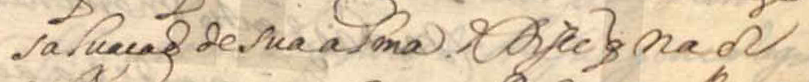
saluaçaõ de sua alma. Disse q̄ naõ
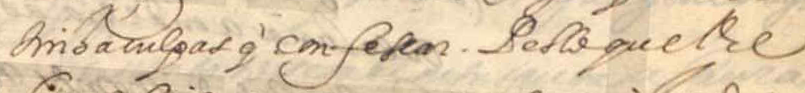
tinha culpas q̄ confessar. Pello que lhe
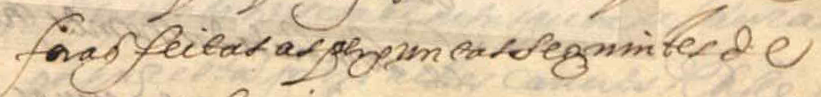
foraõ feitas as perguntas seguintes de
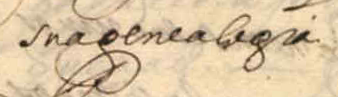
sua genealogia.
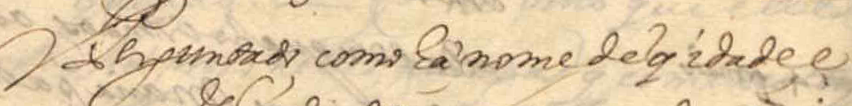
Perguntado como há nome de q̄ idade e
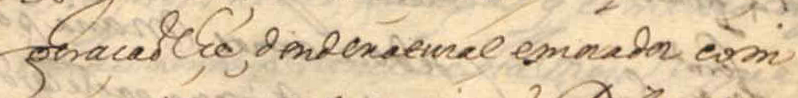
geraçaõ hé donde natural e morador com
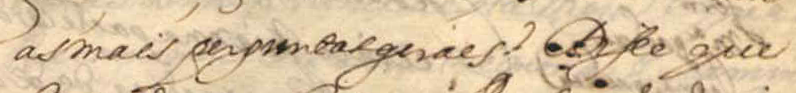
as mais perguntas geraes. Disse que
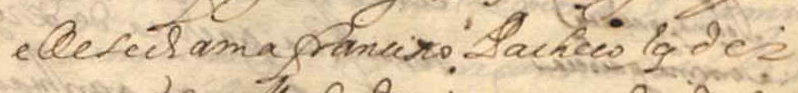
elle se chama francisco Pacheco q̄ dez
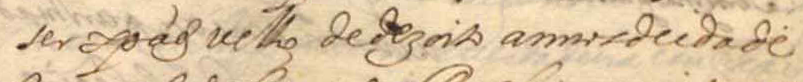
ser xpaõ uelho de dezoito anos de idade
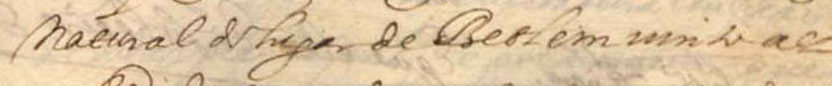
natural do lugar de Betlem uinto a es
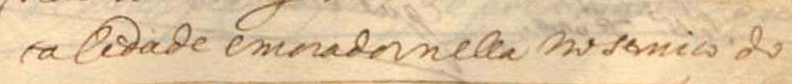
ta Cidade e morador nella no seruiço do
